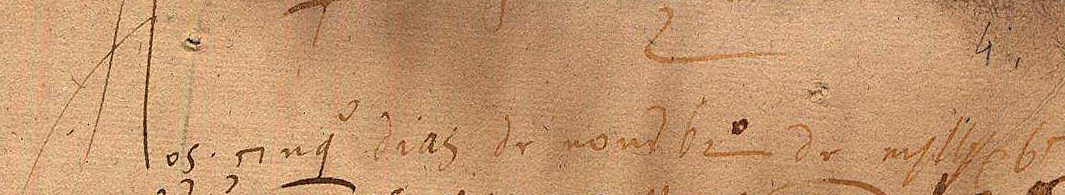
Aos çinqo dias de nouēbro de mjll_ e bc
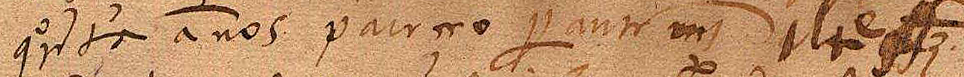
qorēta ānos pareçeo ꝑante m̄j _ lte ff̄z.
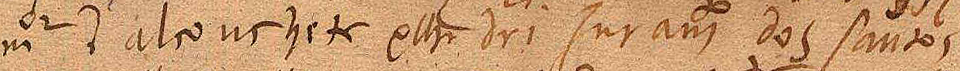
mor ē alcouchete e lhe dei Juramto dos santos
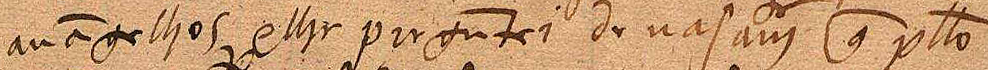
auāgelhos e lhe pregūtei deuasamte q̄ pl̄lo
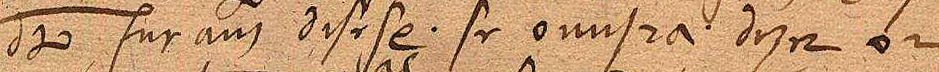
d̄to Juramto disese. se ouujra dizer ou
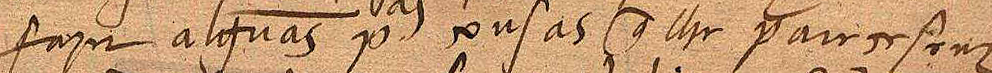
fazer algūas p.as cousas q̄ lhe pareçesem
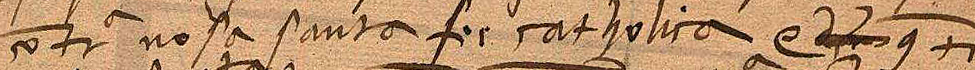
c̄otra nosa santa fee catholica e d__ q̄ ti
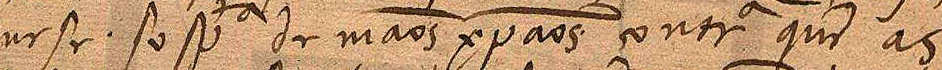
uese . sospta de maos xpãos. contra quē as
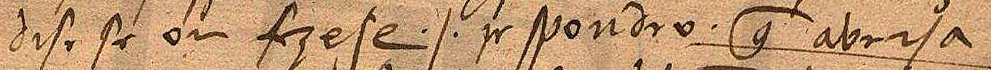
disese ou fezese ./. respondeo . q̄ averja
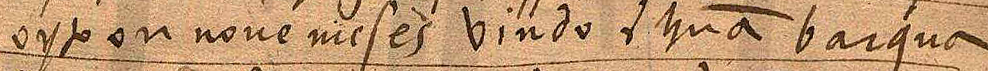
oyto ou noue meses vindo ē huā barqua
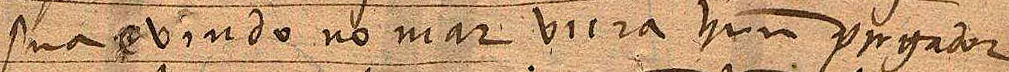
sua e vindo no mar viera hūu pregador
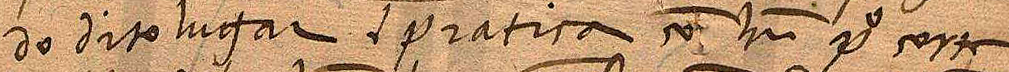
do dito lugar ē pratica cō hū po corte
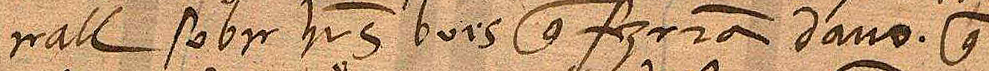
reall sobre hūs boes q̄ fezerā dano. q̄
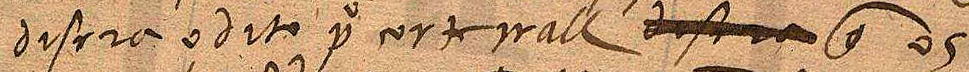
disera o dito po corte reall disera q̄ os
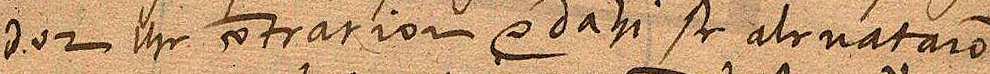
dor lhe c̄otrariou e dahi se aleuatarō
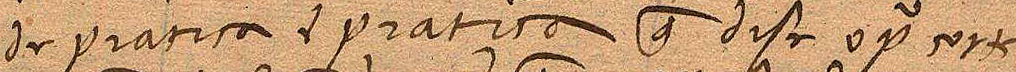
de pratica ē pratica q̄ dise o po corte
